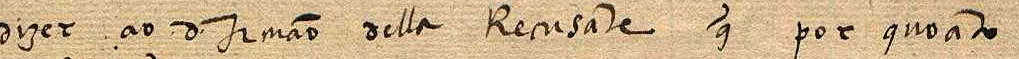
dizer ao d. Jrmão della Recusāte q̄ por quoāto
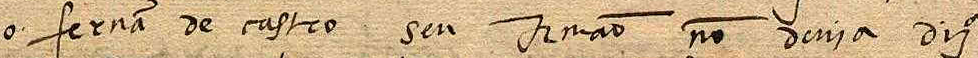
o fernā de castro seu Jrmão n̄o deuja diza
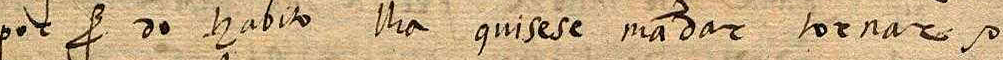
por ꞩ do habito lha quisese mādar tornar e
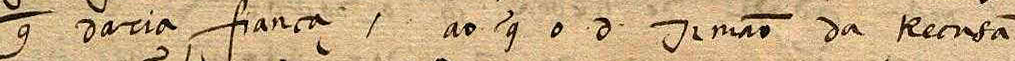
q̄ daria fiança / ao q̄ o d. Jrmão da Recusā
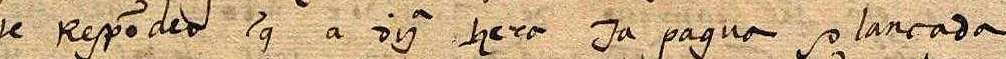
te Respodeo q̄ a diza hera Ja pagua e lançada
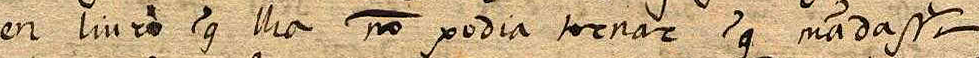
en liuro q̄ lhe n̄o podia tornar q̄ mādasse
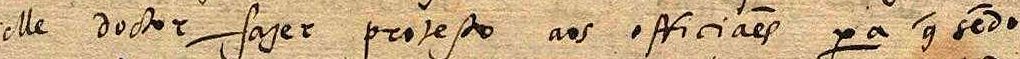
elle doctor fazer protesto aos officiaes ꝑa q̄ sēdo
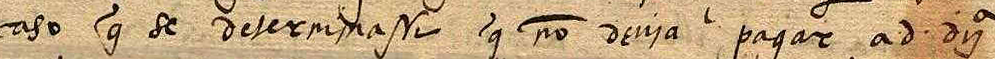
caso q̄ se determinasse q̄ n̄o deuja pagar a d. diza
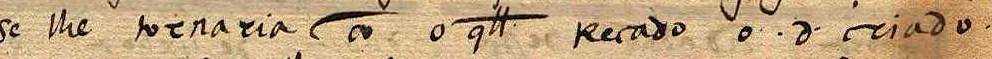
se lhe tornaria c̄o o q̄ll recado o d. criado
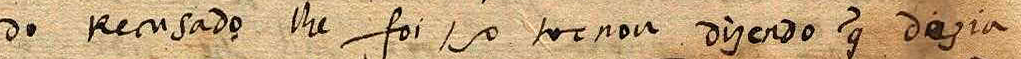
do Recusado lhe foi / e tornou dizendo q̄ dezia
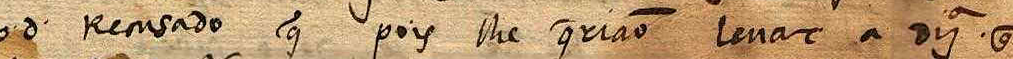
o d. Recusado q̄ pois lhe q̄rião leuar a diza. q̄
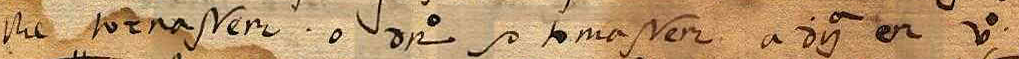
lhe tornassem o drro e tomassem a diza em vo.
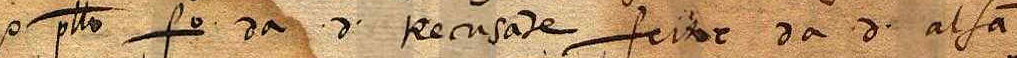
e p̄llo fo da d. Recusāte feitor da d. alfā
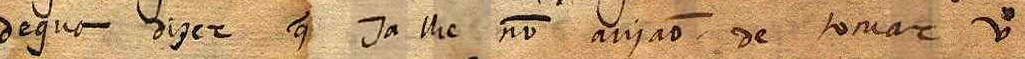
degua dizer q̄ Ja lhe n̄o aujão de tomar vo
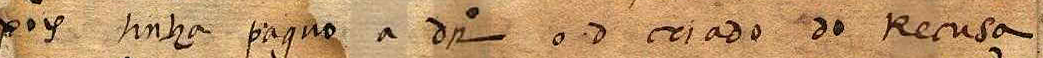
pois tinha paguo a drro o d criado do Recusa
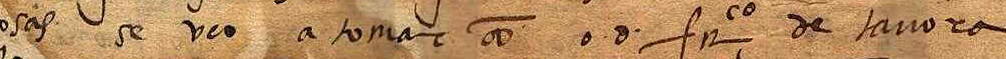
losas se veo a tomar c̄o o d. frrco de tauora
